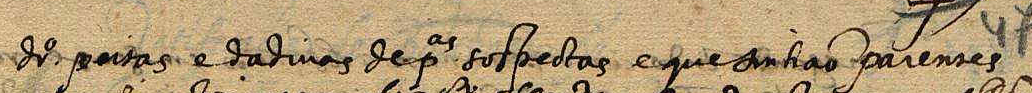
dro. peitas e dadiuas de pas sospectas e que tinhaõ parentes
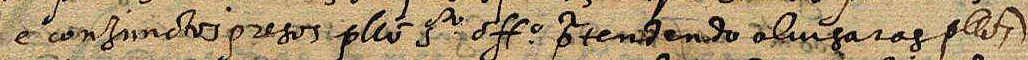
e conJunctos presos pllō scto. off.o p̄tendendo aluisaras pllos̄
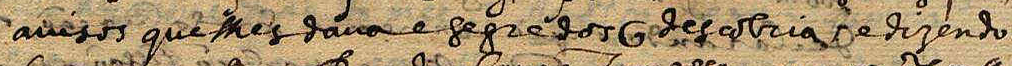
auisos que lhes daua e segredos q̄ descobria e dizendo
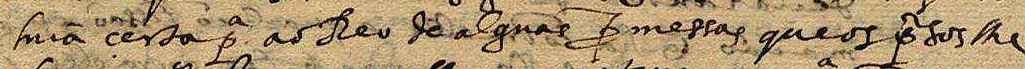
huā certa pa ao Reo de alguas̄ ꝓmessas que os p̄sos lhe
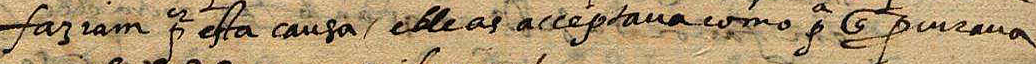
faziam por esta causa / elle as acceptaua como pa q̄ ꝓcuraua
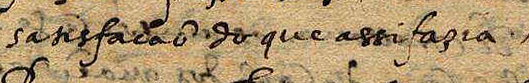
satisfaçaõ do que assi fazia ./
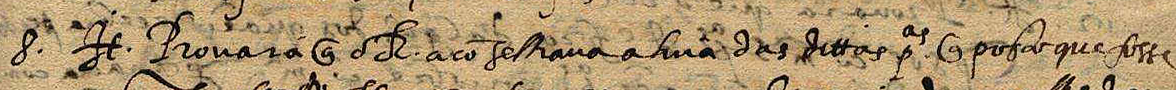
8. Jt. Prouara q̄ o R. acōselhaua a huā das dittas pas q̄ posto que fosse
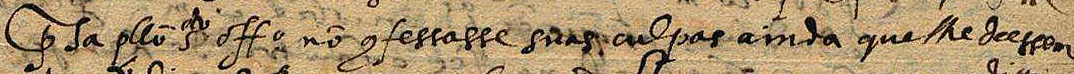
p̄sa pllō sto offo nō ꝯfessasse suas culpas ainda que lhe deessem
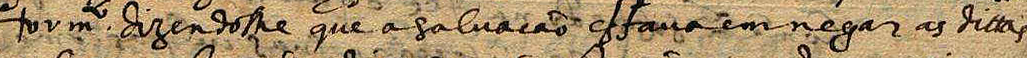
tormto. dizendolhe que a saluaçaõ estaua em negar as dittas
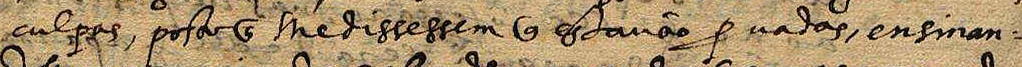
culpas, posto q̄ lhe dissessem q̄ estauão ꝓuadas, ensinan
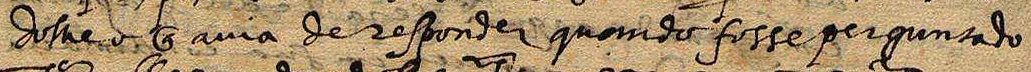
dolhe o q̄ auia de responder quando fosse perguntado
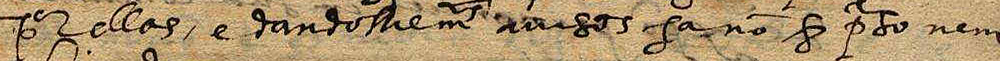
por ellas, e dandolhe mtos auisos ꝑa nō ꞩ p̄so nem
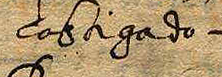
castigado
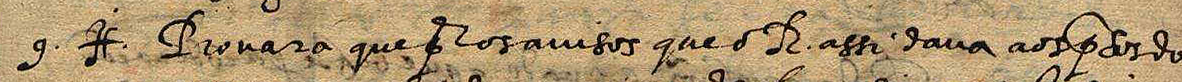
9. It. Prouara que por os auisos que o R. assi daua aos p̄sos do
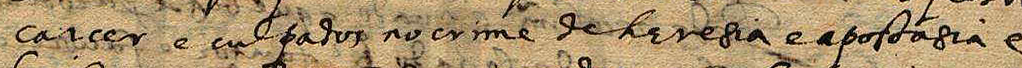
carcer e culpados no crime de heresia e apostasia e
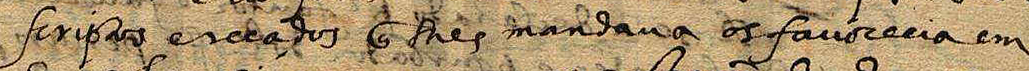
scriptos e recados q̄ lhes mandaua os fauorecia em
